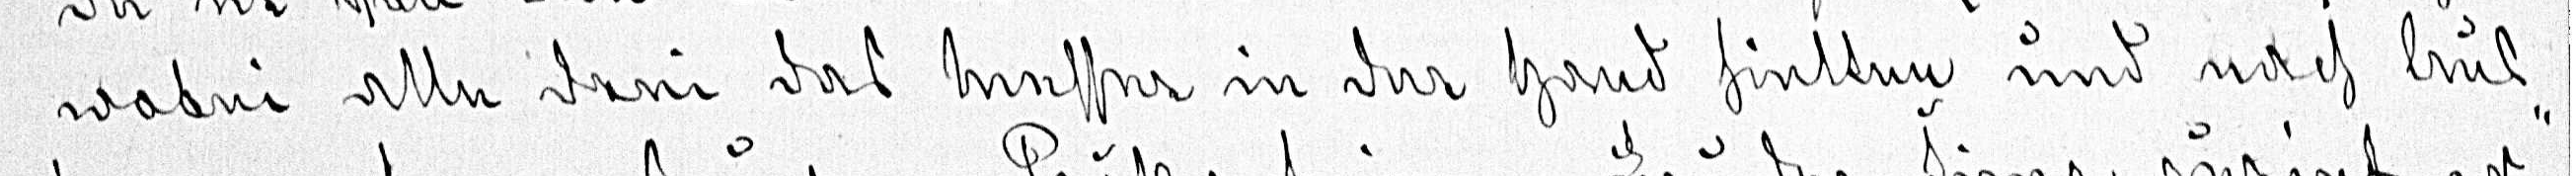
wobei alle drei das Messer in der Hand hielten und nach Aus¬
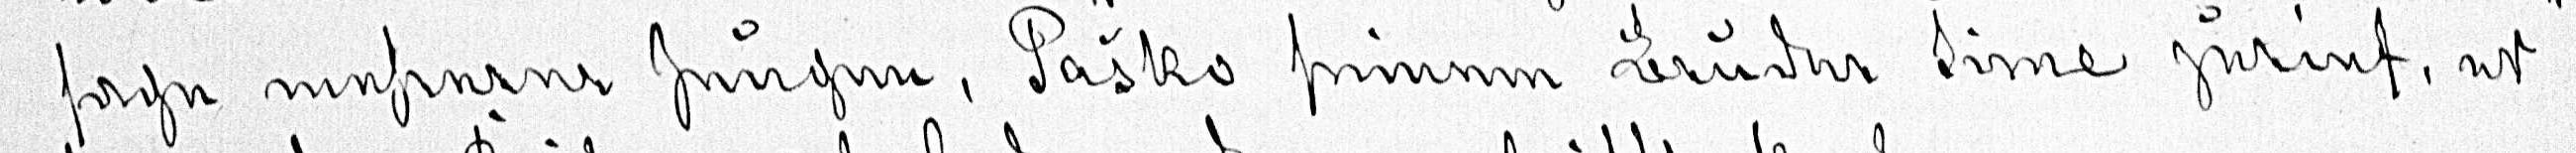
sage mehrere Zeugen, Paško seinem Bruder Šime zurief, er
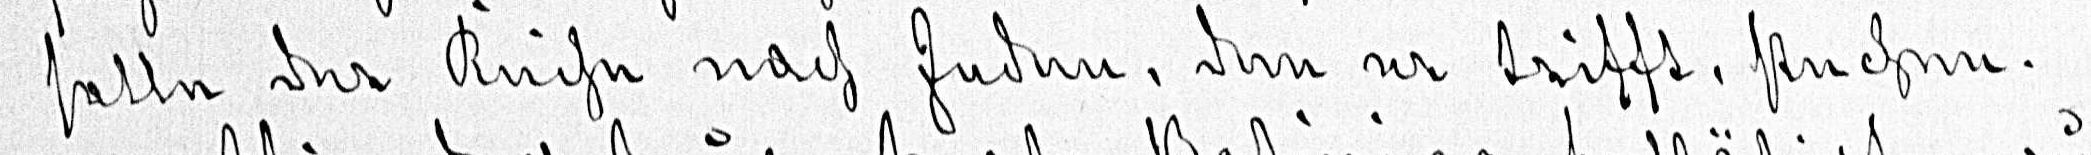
solle den Reihe nach Jeden, den er trifft, stechen.
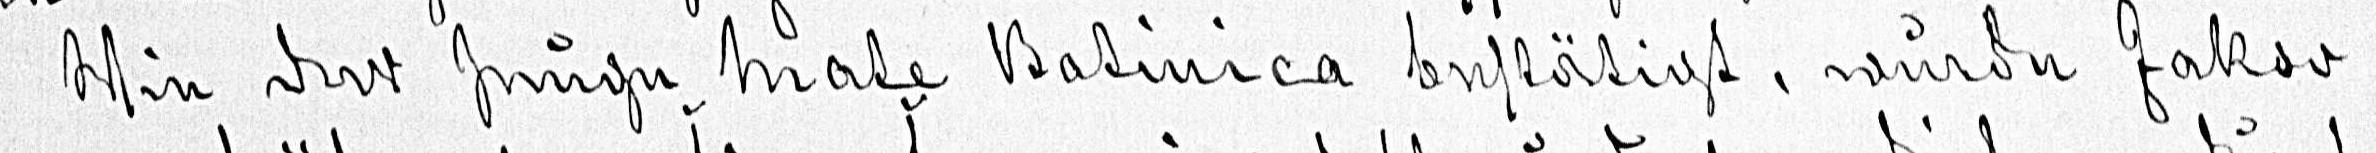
Wie der Junge Mate Batinica bestätigt, wurde Jakov
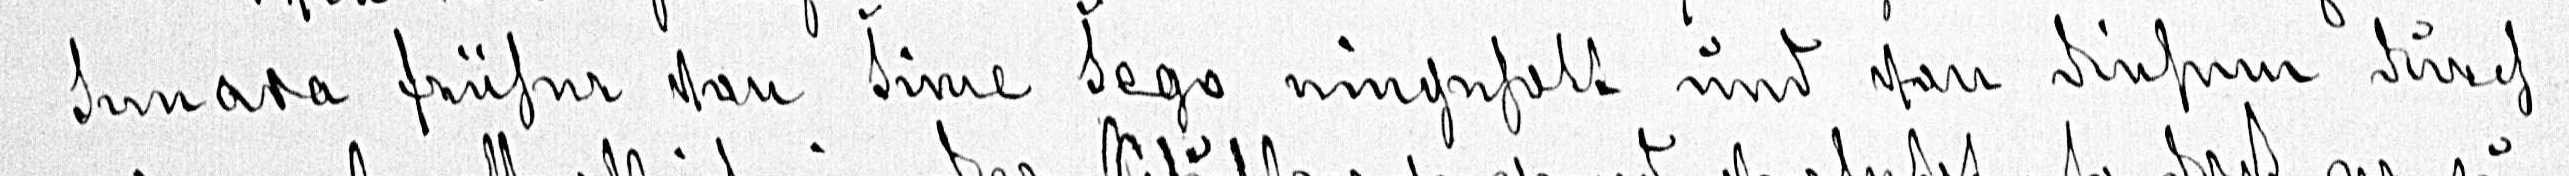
Iunara früher von Šime Šego eingeholt und von diesem durch
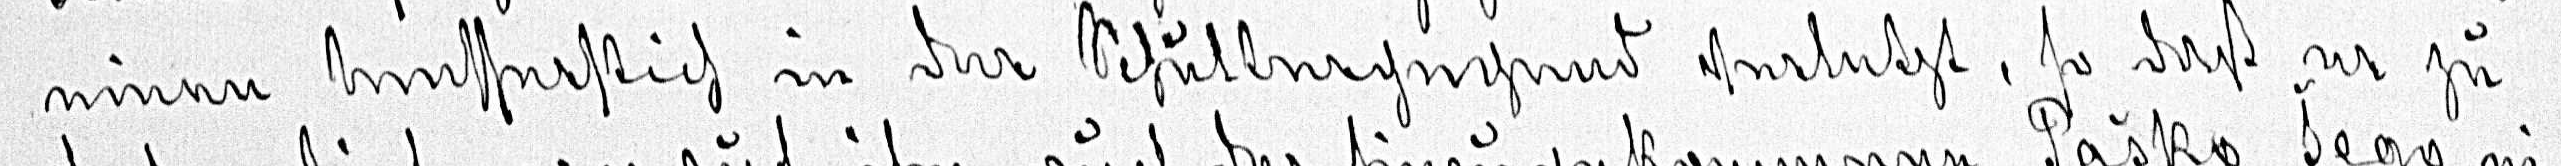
einen Messerstich in der Schultergegend verletzt, so daß er zu
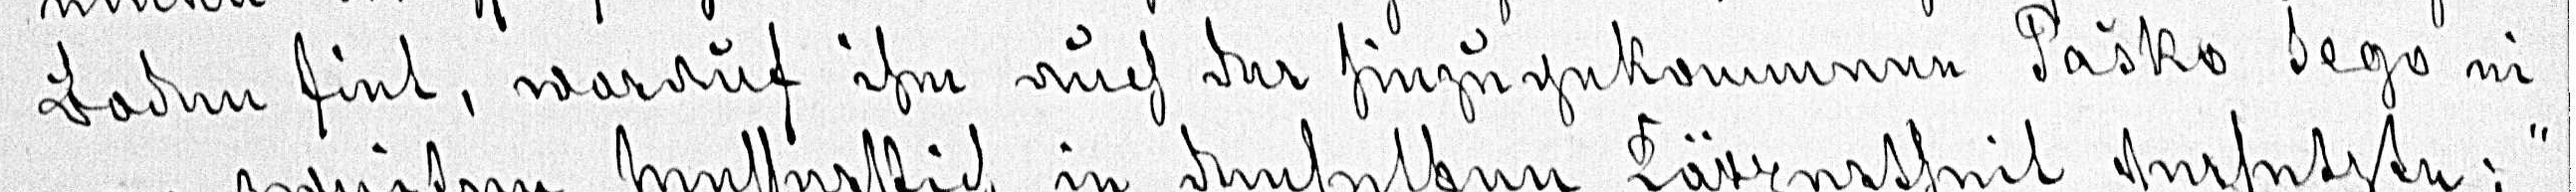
Boden fiel, worauf ihm auch der Hinzugekommene Paško Šego ei¬
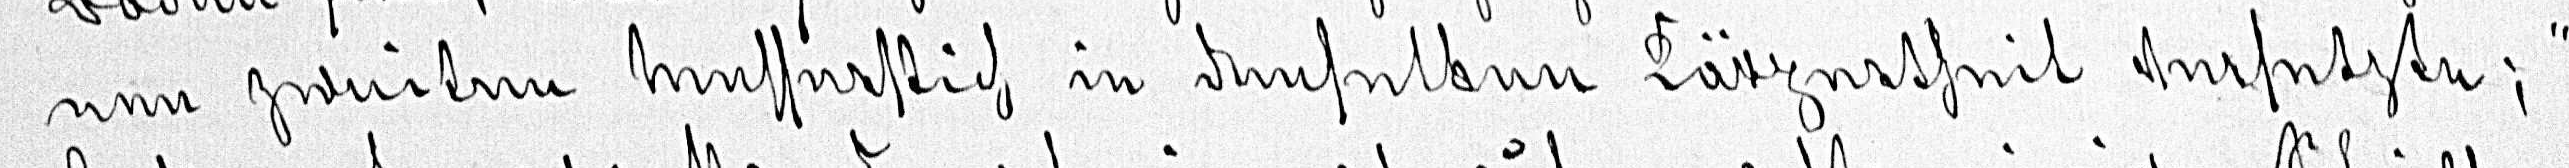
nen zweiten Messerstich in denselben Körpertheil versetzte;
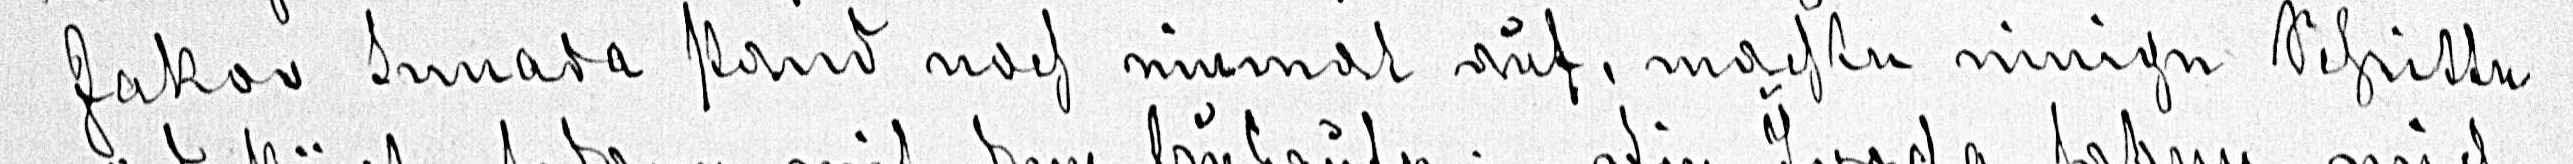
Jakov stand noch einmal auf, machte einige Schritte
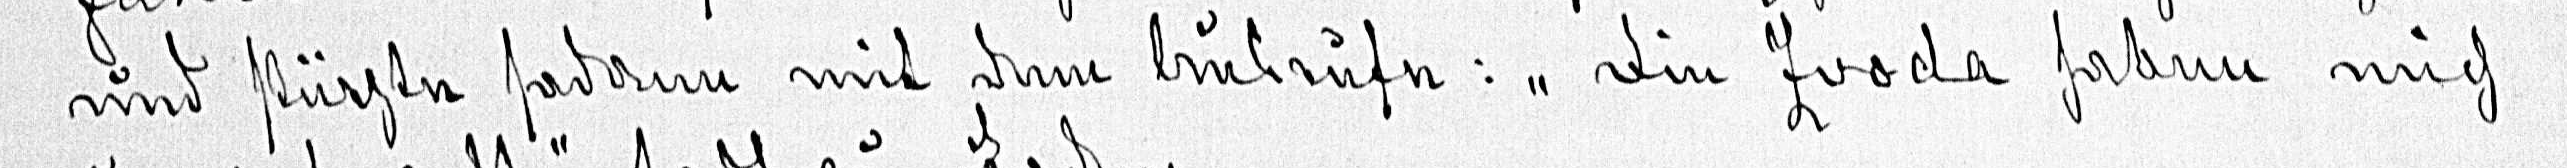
und stützte sodann mit dem Ausrufe: „die Žvoda haben mich
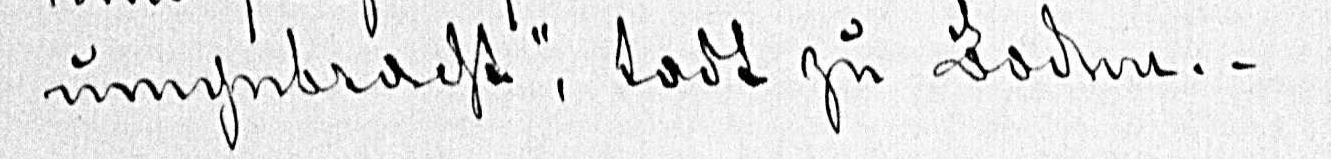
umgebracht,“ todt zu Boden.–
